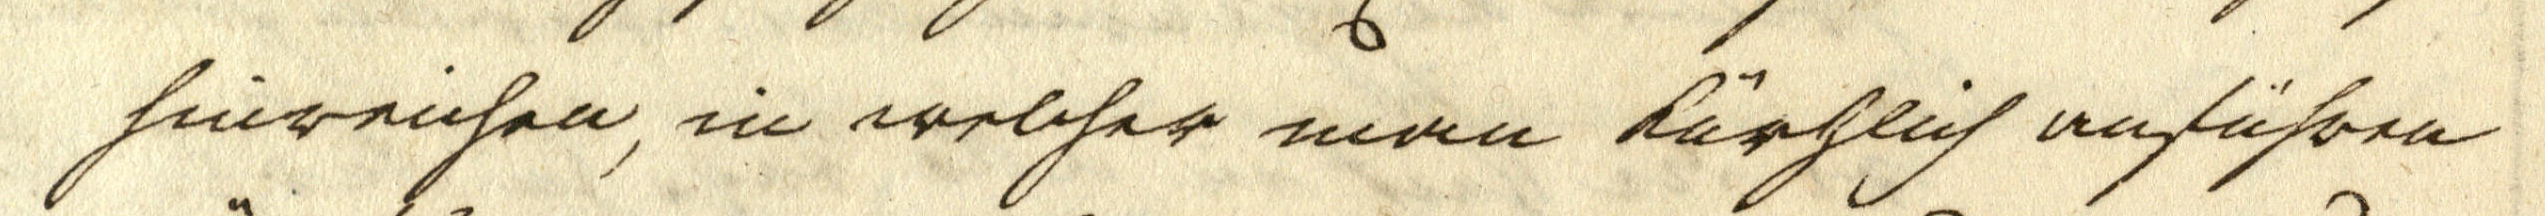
hinreichen, in welcher man kürzlich anführen
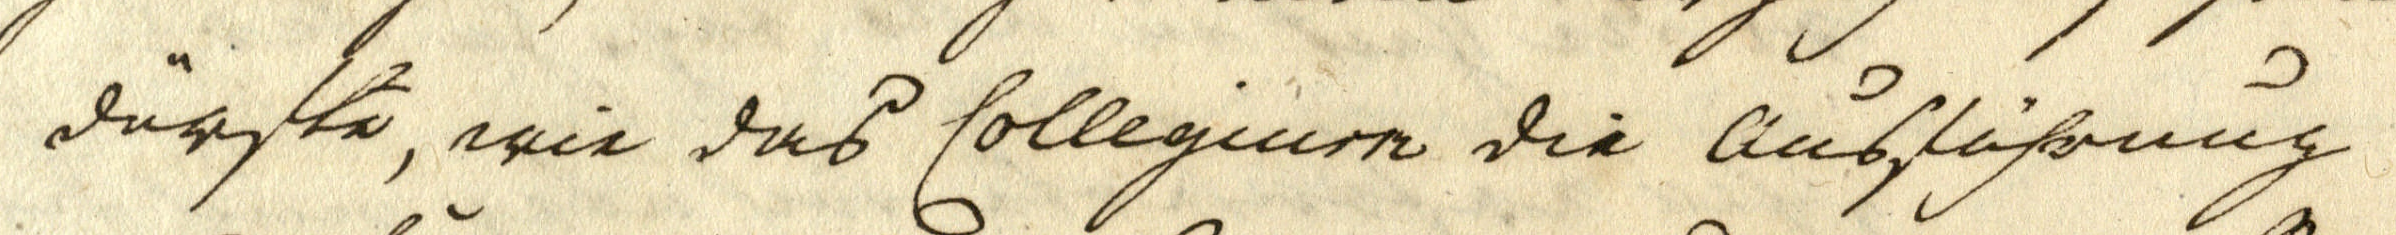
dürfte, wie das Collegium die Ausführung
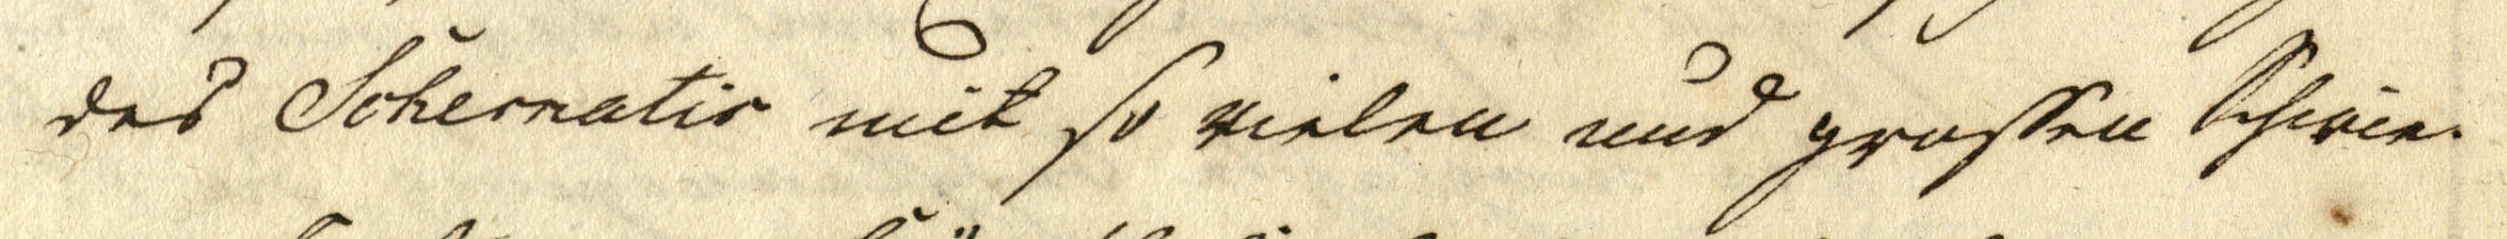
des Schematis mit so vielen und grossen Schwie-
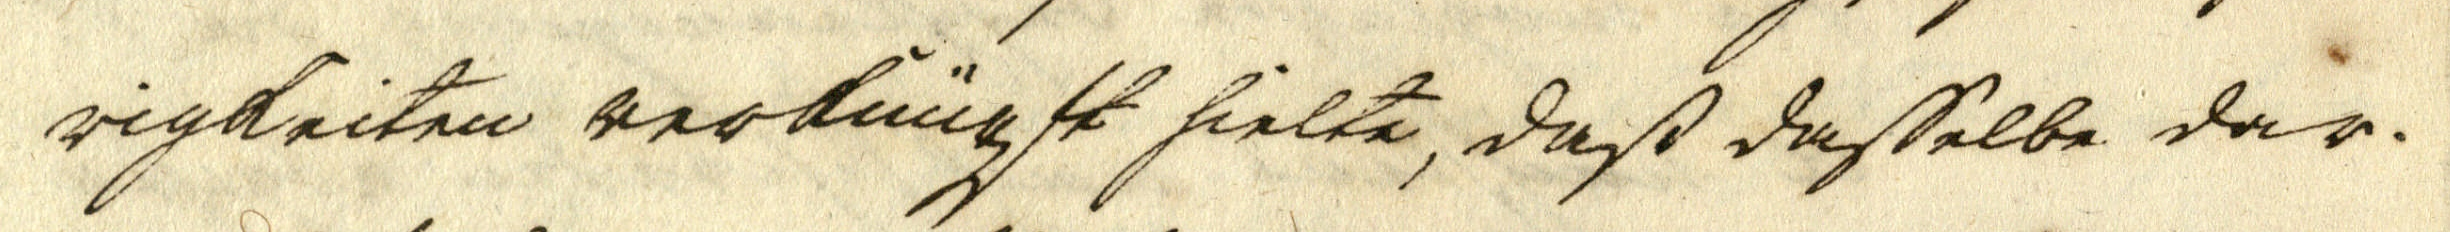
rigkeiten verknüpft hielte, daß dasselbe dar-
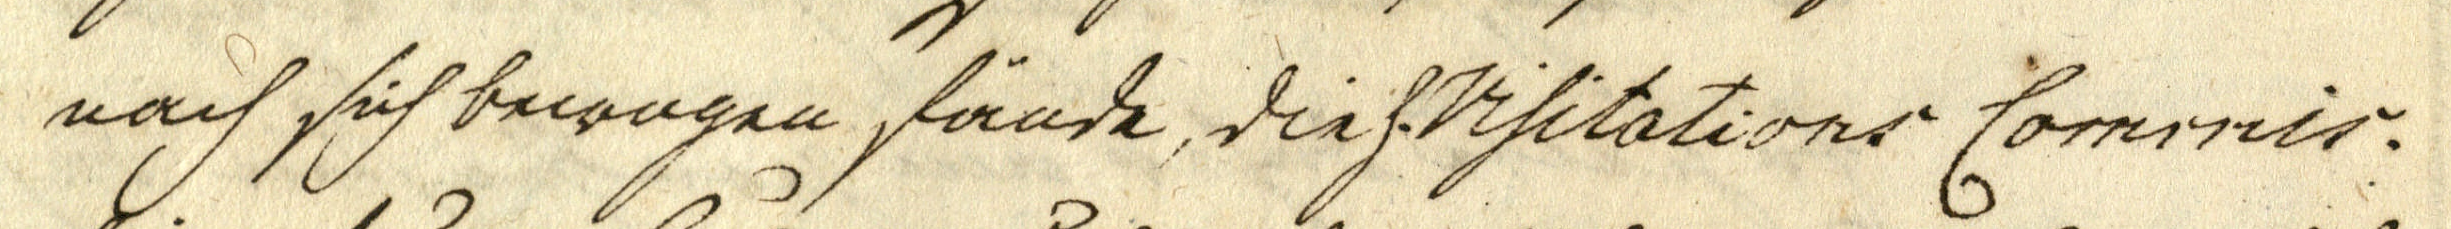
nach sich bewogen fände, die h. Visitations Commis-
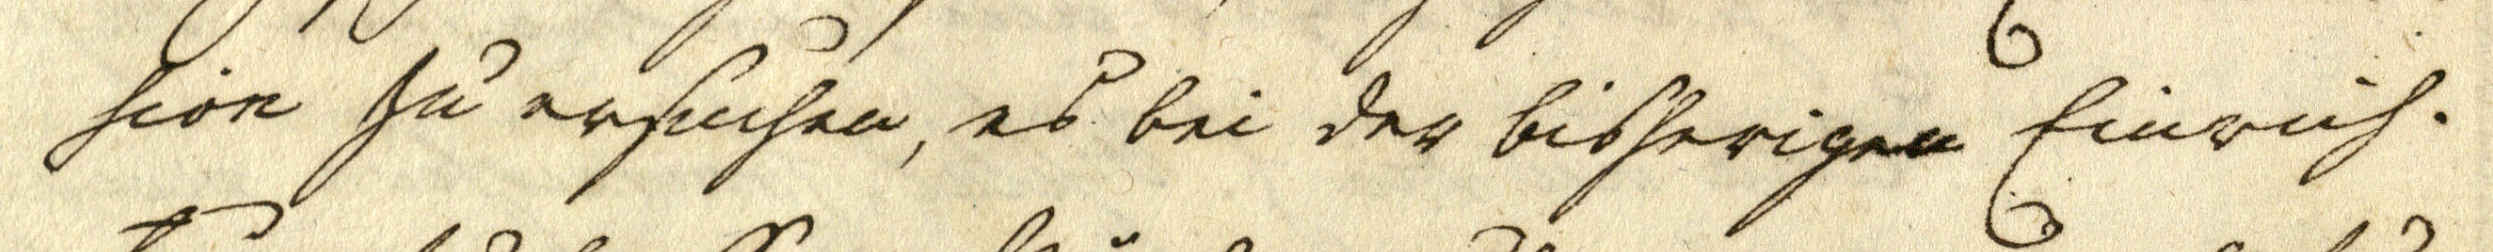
sion zu ersuchen, es bei der bisherigen Einrich-
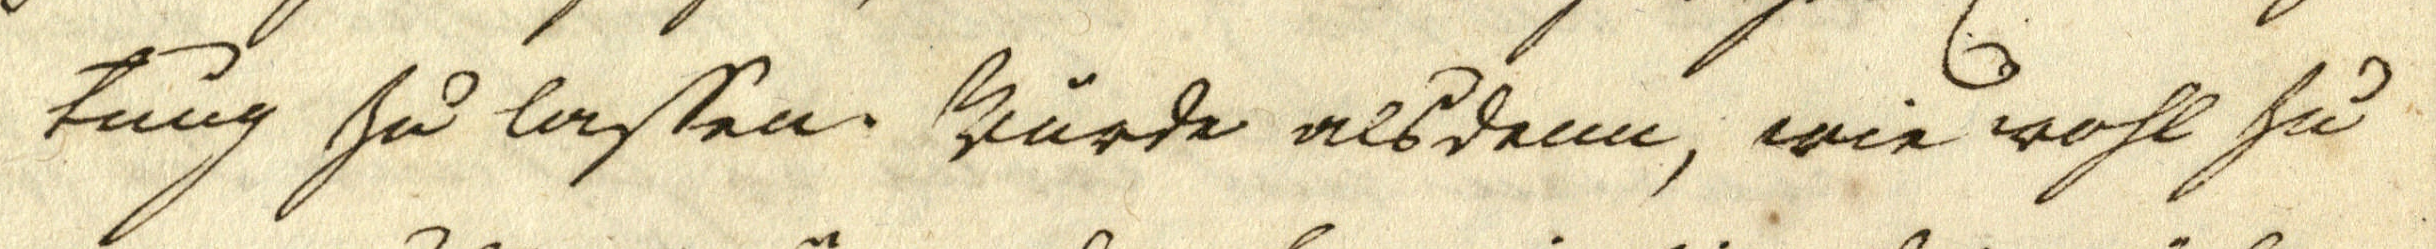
tung zu lassen. Würde alsdann, wie wohl zu
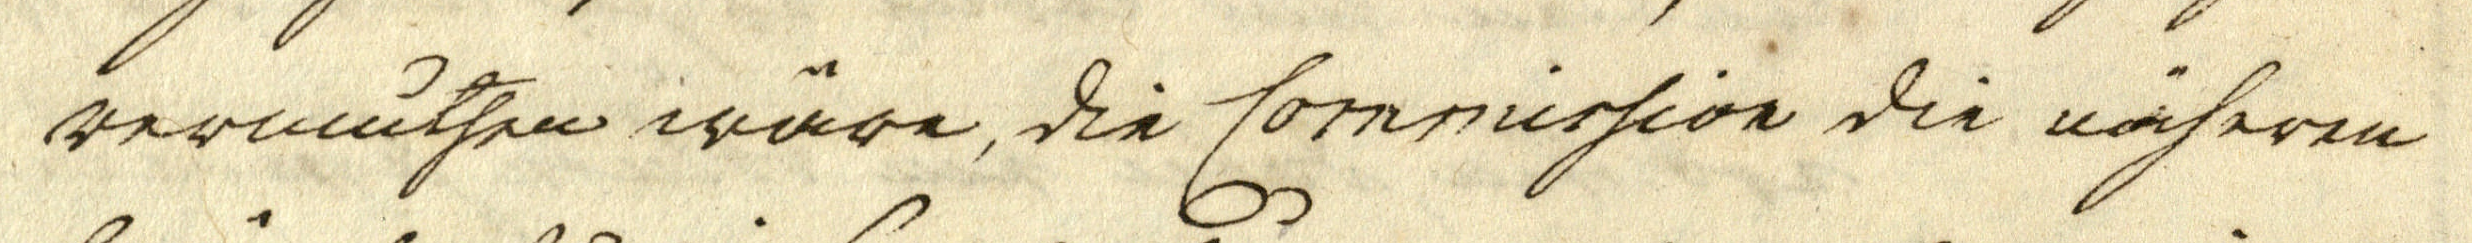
vermuthen wäre, die Commission die näheren
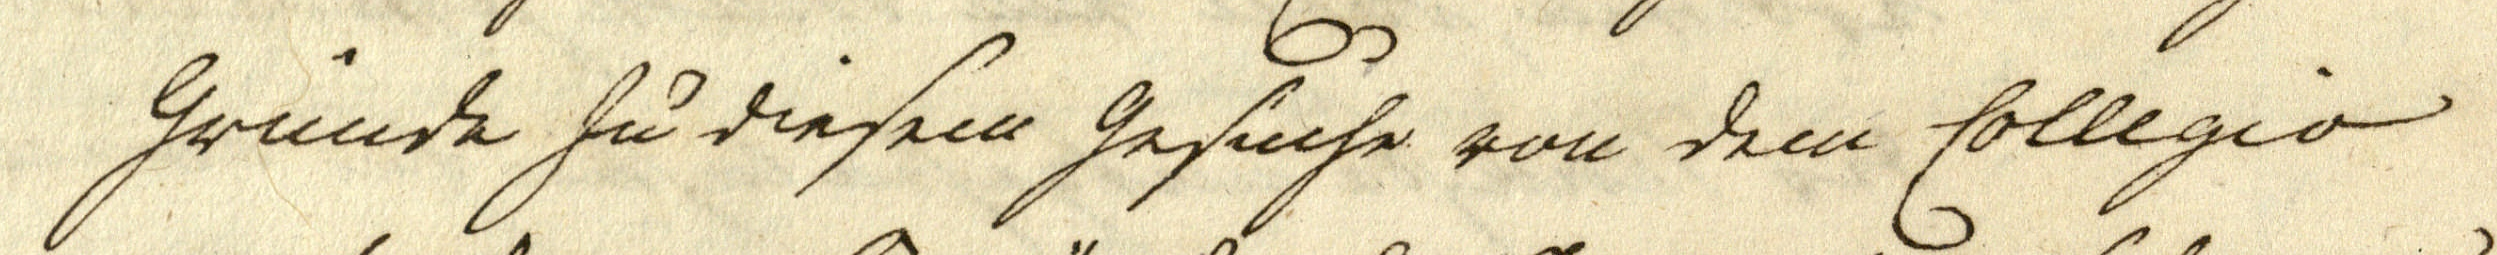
Gründe zu diesem Gesuche von dem Collegio
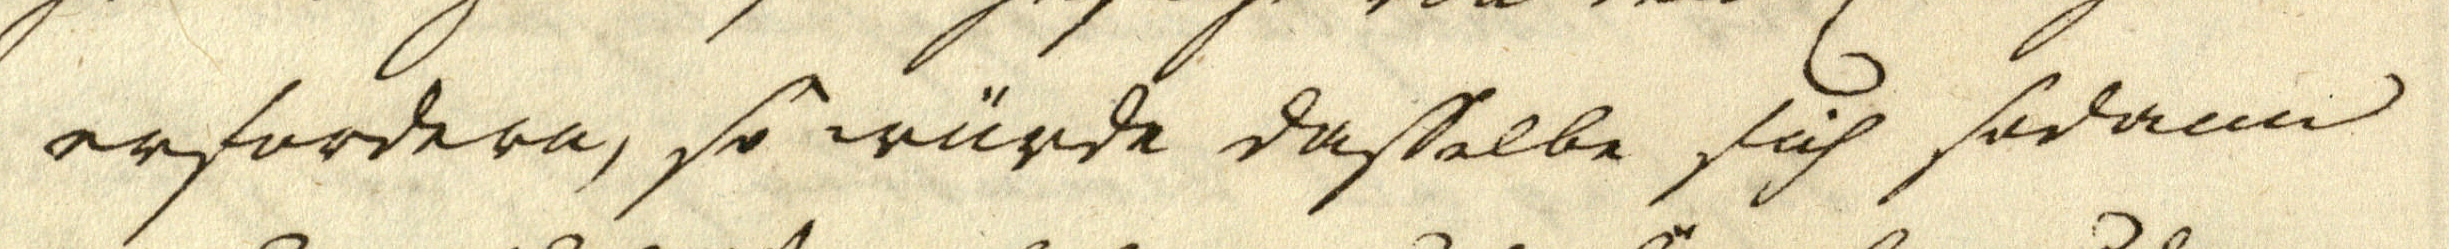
erfordern, so würde dasselbe sich sodann
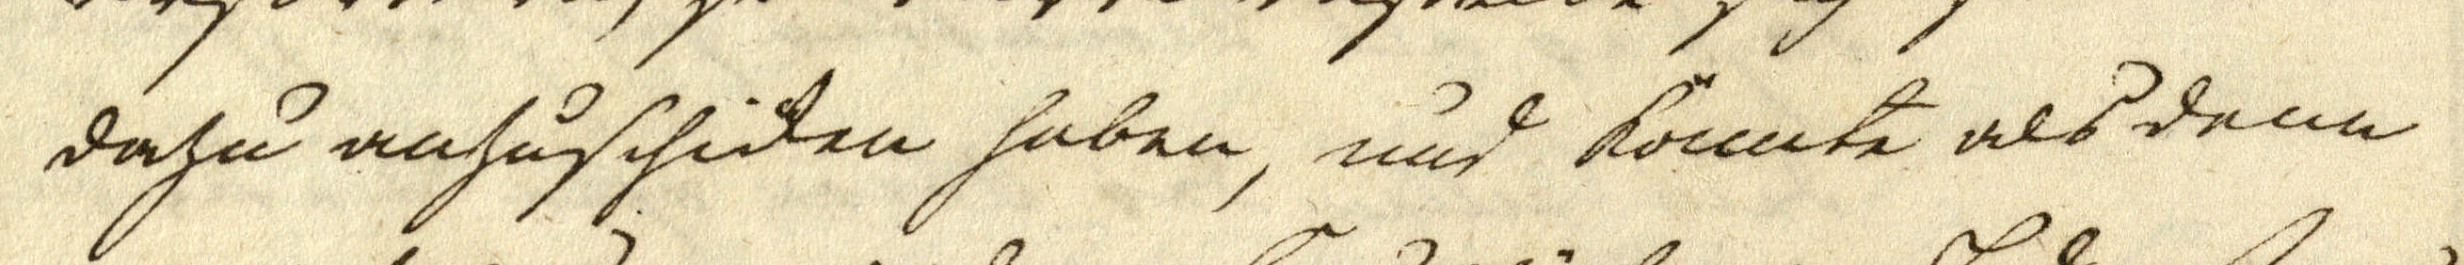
dazu anzuschicken haben, und könnte alsdenn
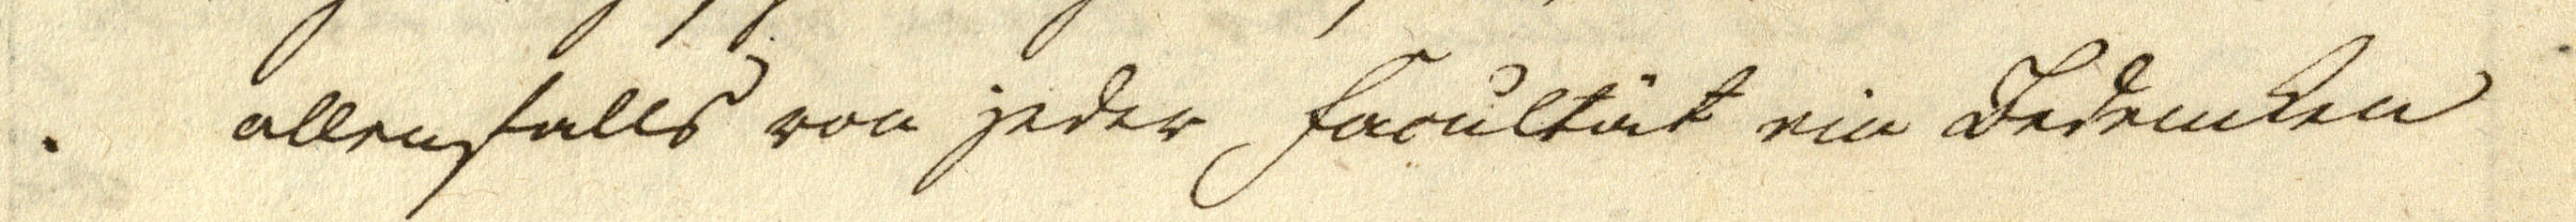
allenfalls von jeder Facultät ein Bedenken
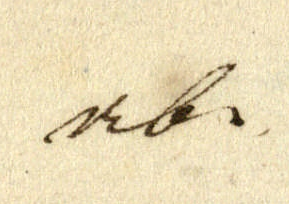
ab-
